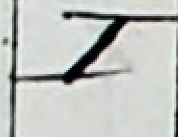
I
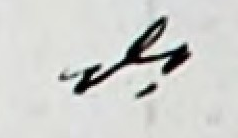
do
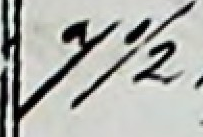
7 ½
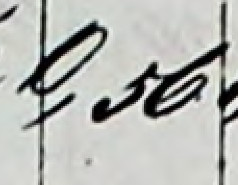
0,56
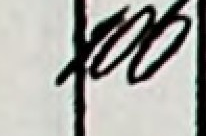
106
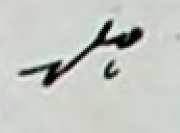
do
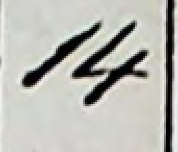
14
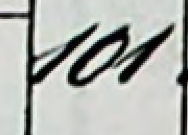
101
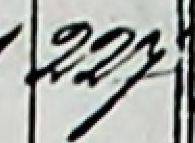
227
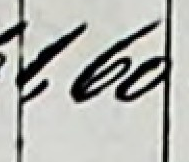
1,60
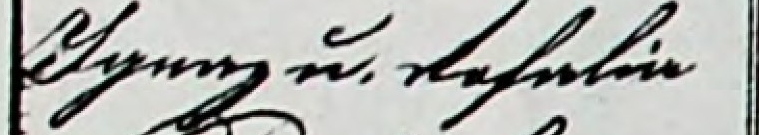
Ignaz u. Rosalia
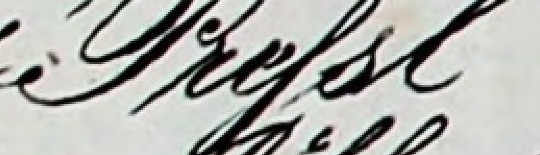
Pressl
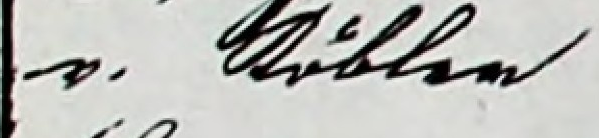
v. Köbler
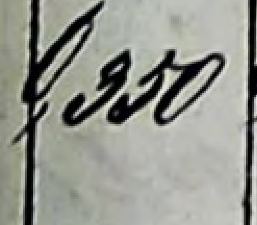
0,350
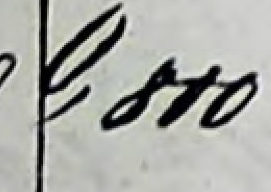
0,810
